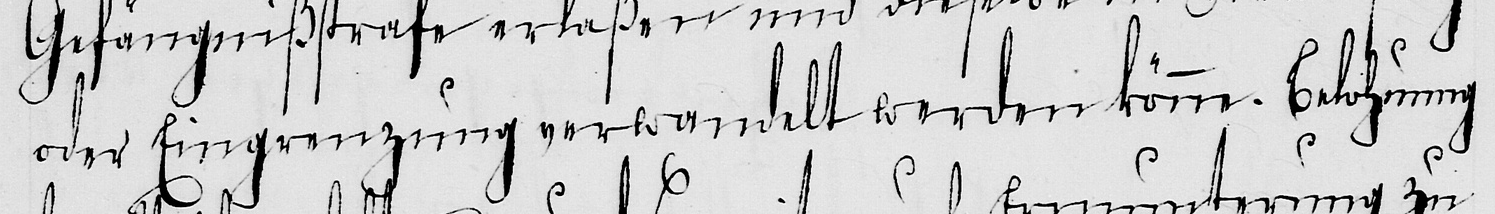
oder Eingrenzung verwandelt werden könne. Belohnung
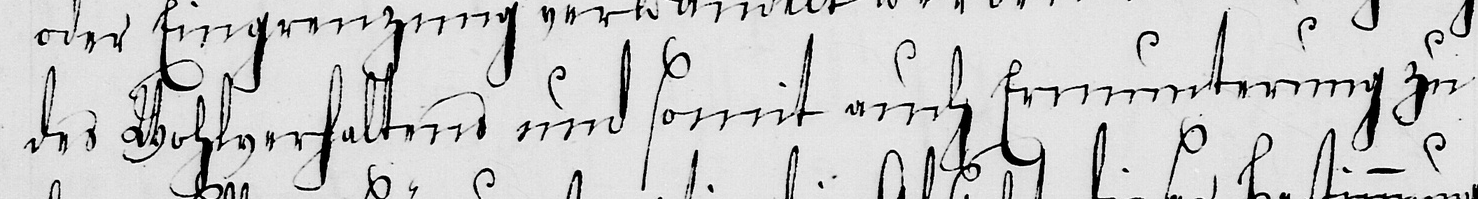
des Wohlverhaltens und somit auch Ermunterung zu
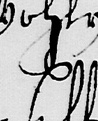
legen
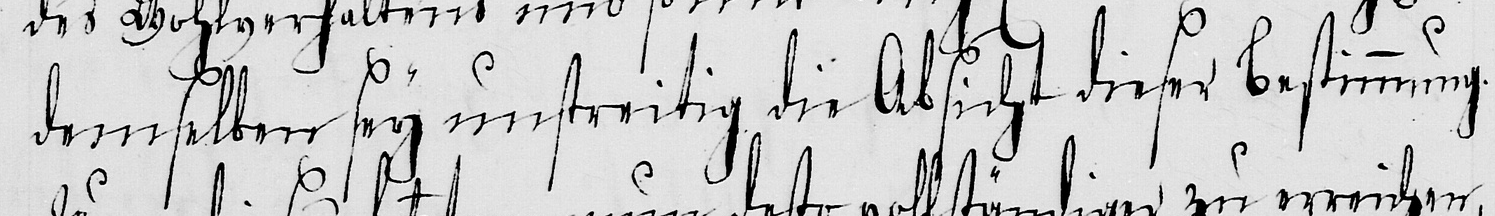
demselben sey unstreitig die Absicht dieser Bestimmung.
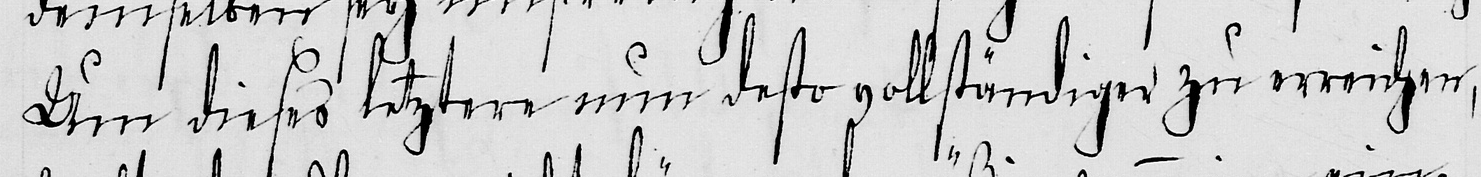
Um dieses letztere nun desto vollständiger zu erreichen,
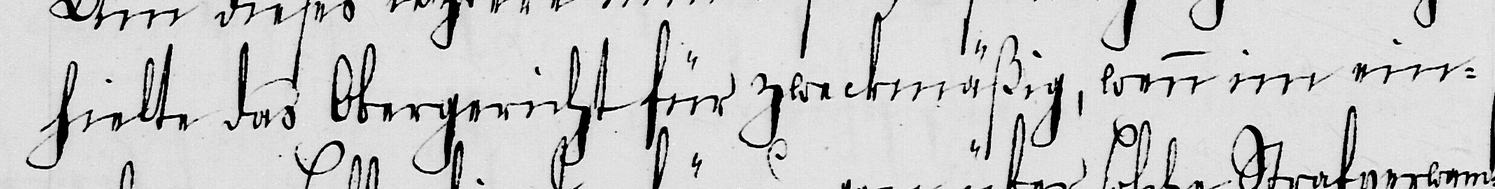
hielte das Obergericht für zweckmäßig, wenn im ein¬
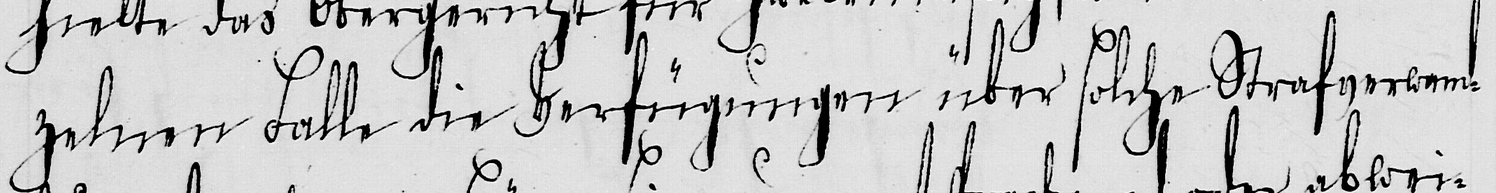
zelnen Falle die Verfügungen über solche Strafverwand¬
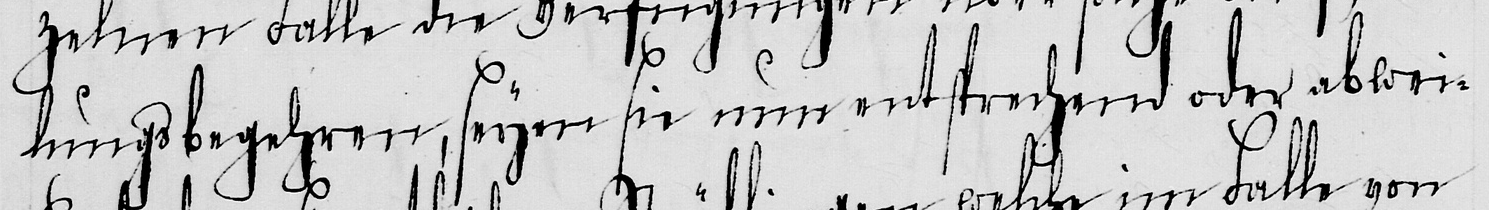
lungsbegehren, seyen sie nun entsprechend oder abwei¬
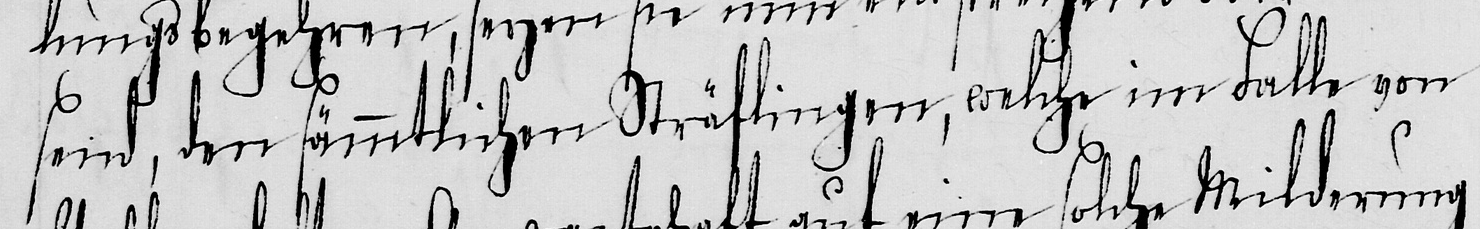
send, den sämmtlichen Sträflingen, welche im Falle von
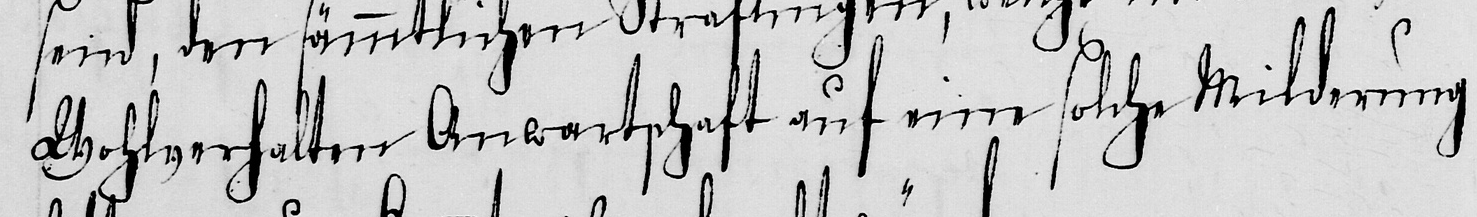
Wohlverhalten Anwartschaft auf eine solche Milderung
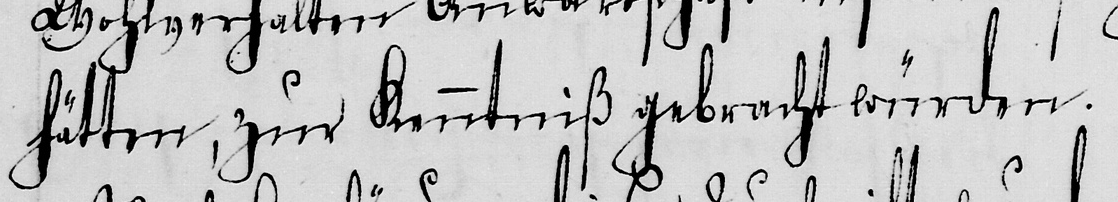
hätten, zur Kenntniß gebracht würden.
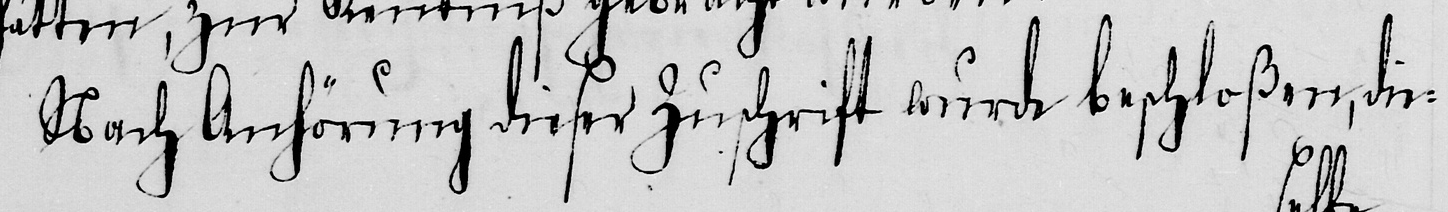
Nach Anhörung dieser Zuschrift wurde beschloßen, di¬
